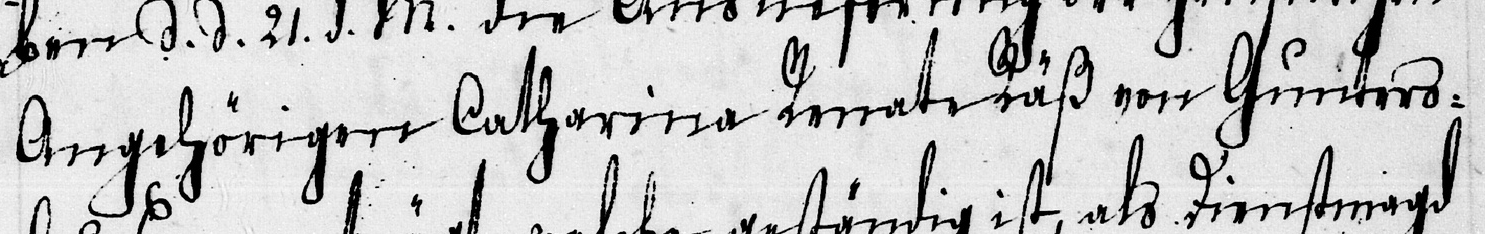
Angehörigen Catharina Renate Räß von Gunters¬
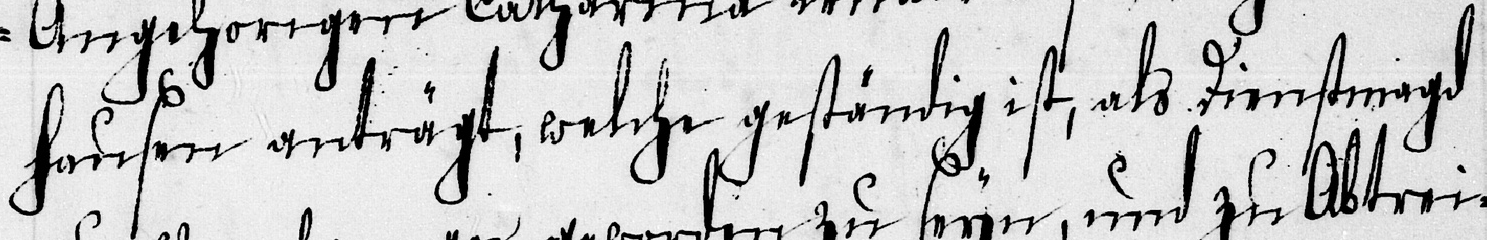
hausen anträgt, welche geständig ist, als Dienstmagd
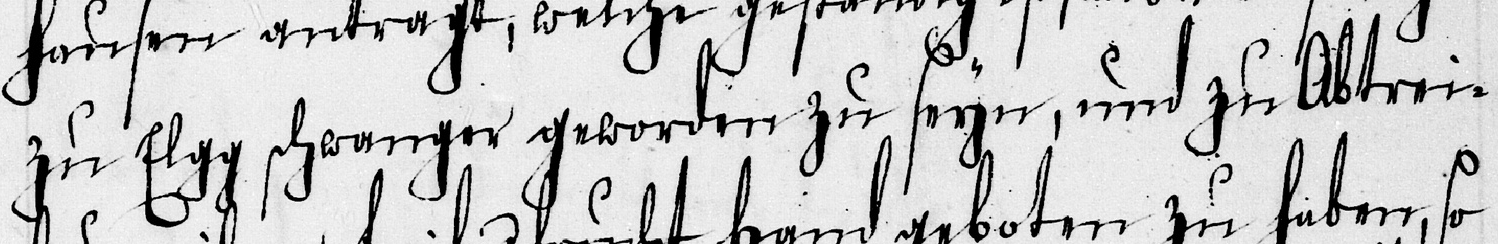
zu Elgg schwanger geworden zu seyn, und zu Abtrei¬
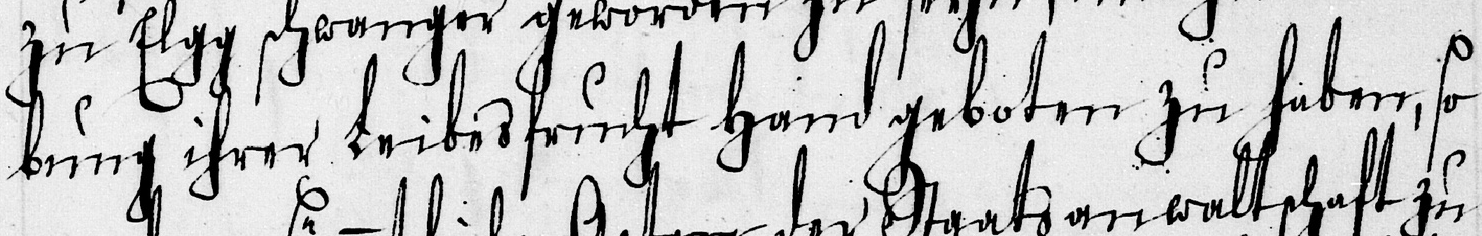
bung ihrer Leibesfrucht Hand geboten zu haben, so
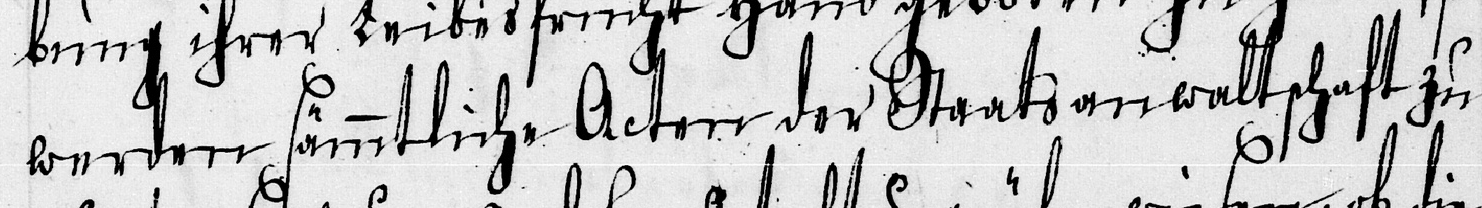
werden sämmtliche Acten der Staatsanwaltschaft zu
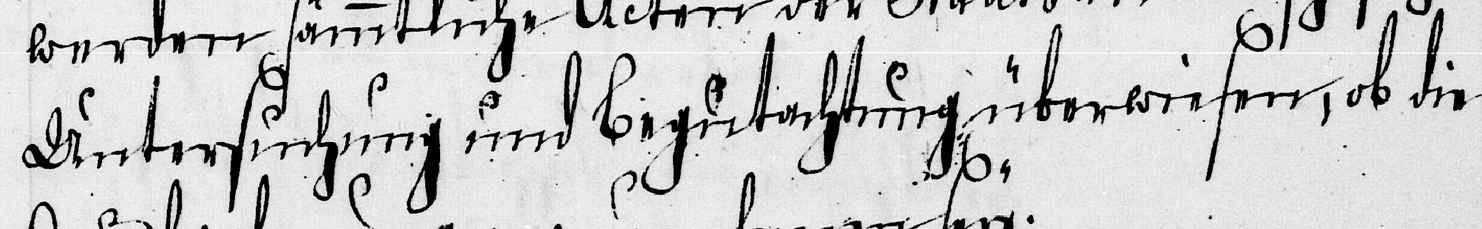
Untersuchung und Begutachtung überwiesen, ob die
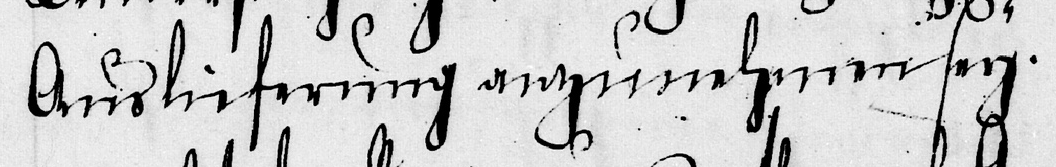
Auslieferung anzunehmen sey.
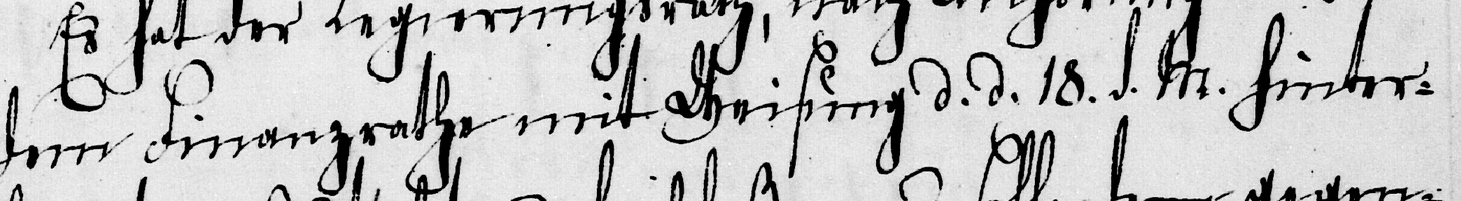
dem Finanzrathe mit Weisung d. d. 18. d. M. hinter¬
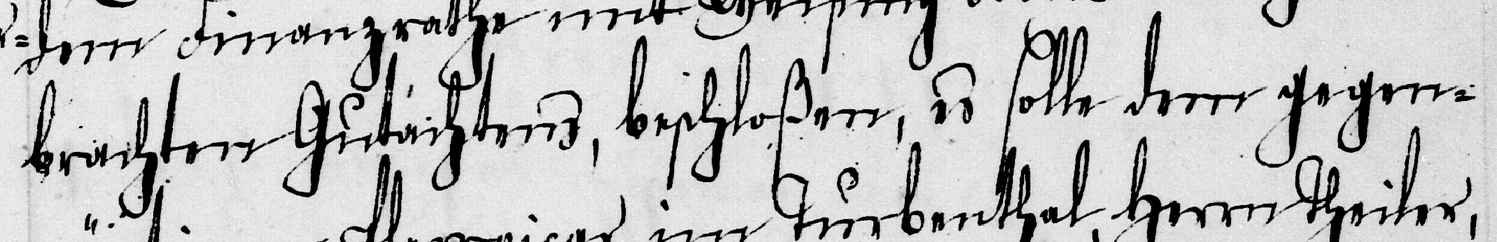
brachten Gutachtens, beschloßen, es solle dem gegen¬
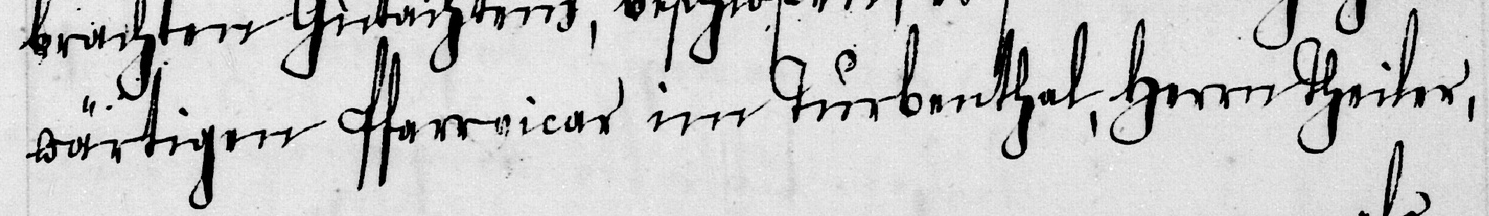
wärtigen Pfarrvicar im Turbenthal, Herrn Theiler,
